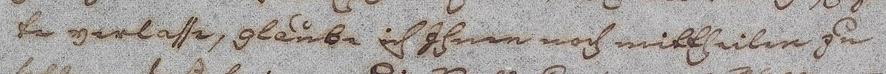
te verlasse, glaube ich Ihnen noch mittheilen zu
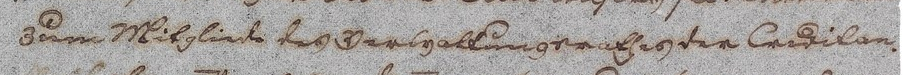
zum Mitgliede des Verwaltungsrathes der Creditan-
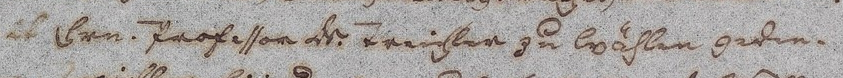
stalt Hrn. Professor Dr. Treichler zu wählen geden-
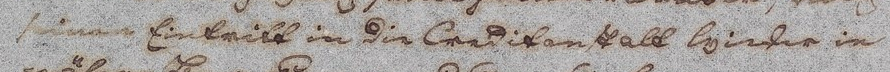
seinen Eintritt in die Creditanstalt wieder in
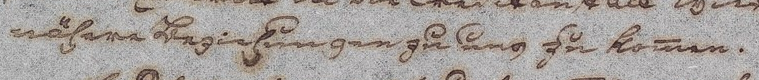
nähere Beziehungen zu uns zu kommen.
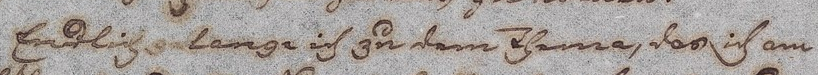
Endlich gelange ich zu dem Thema, das ich am
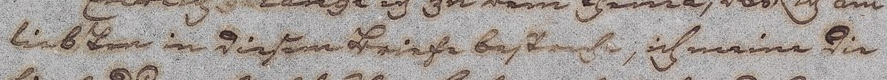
liebsten in diesem Briefe bespreche, ich meine die
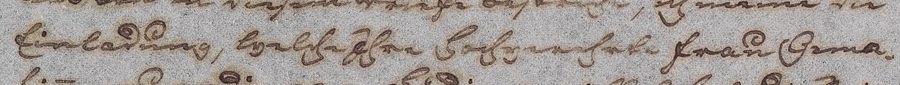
Einladung, welche Ihre hochverehrte Frau Gema-
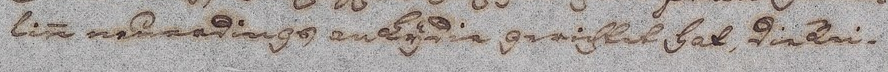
linn neuerdings an Lydie gerichtet hat, die Rei-
